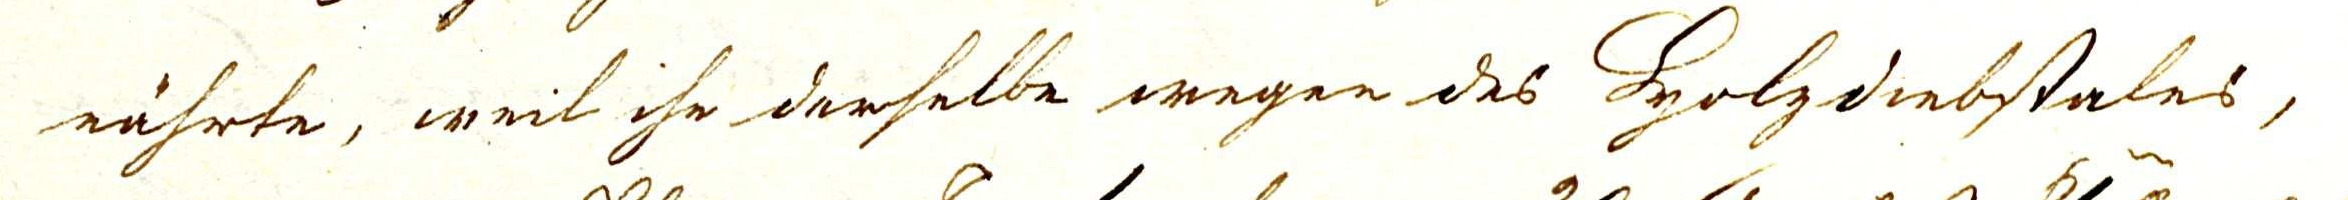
rührte, weil ihn derselbe wegen des Holzdiebstales,
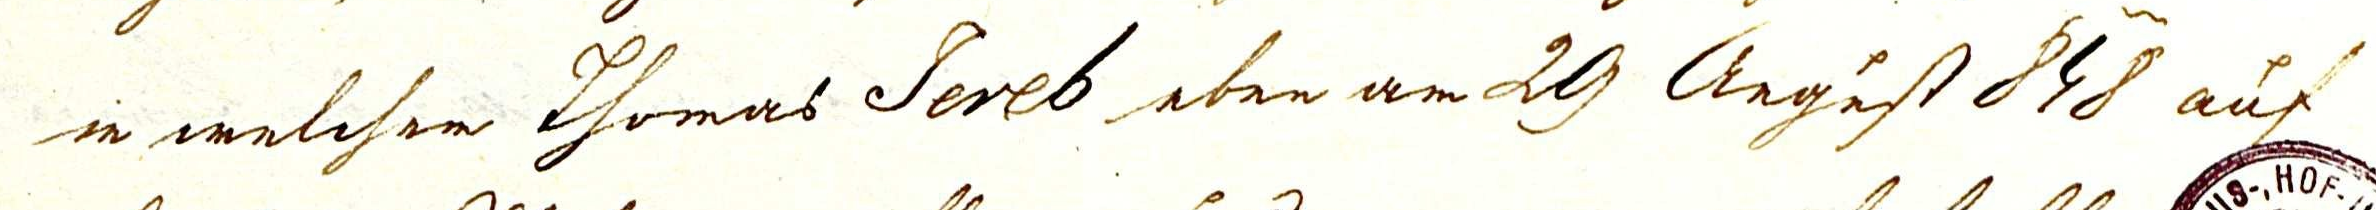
in welchem Thomas Jereb eben am 29. August 1848 auf
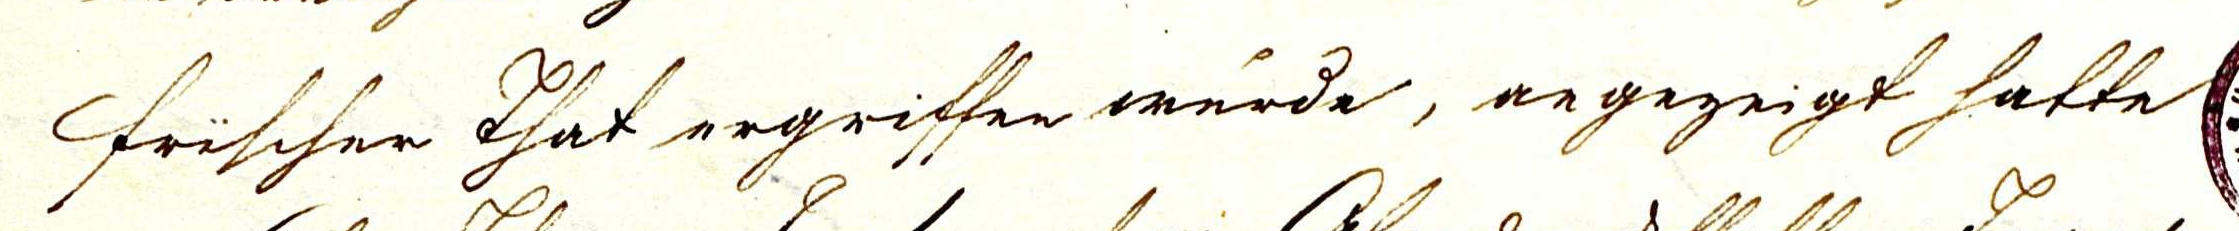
frischer That ergriffen wurde, angezeigt hatte.
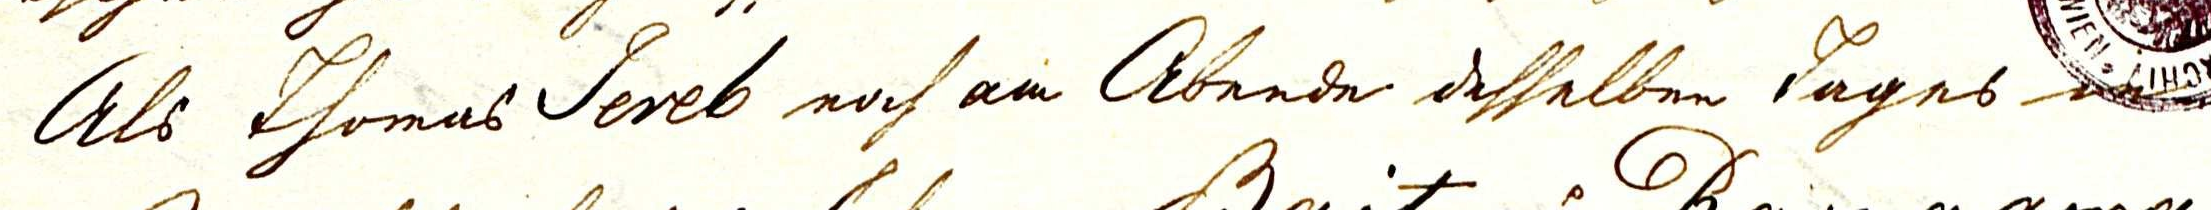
Als Thomas Jereb noch am Abende desselben Tages an
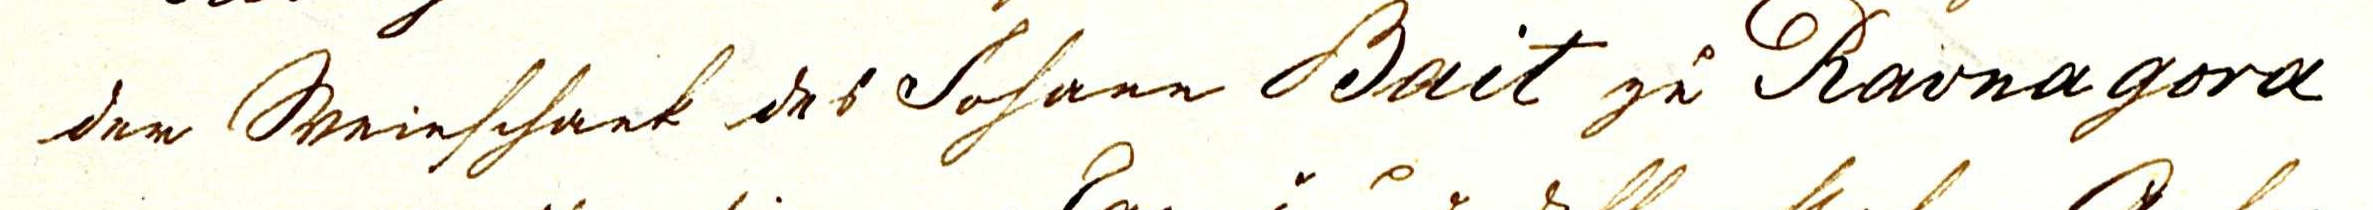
der Weinschank des Johann Bait zu Ravna gora
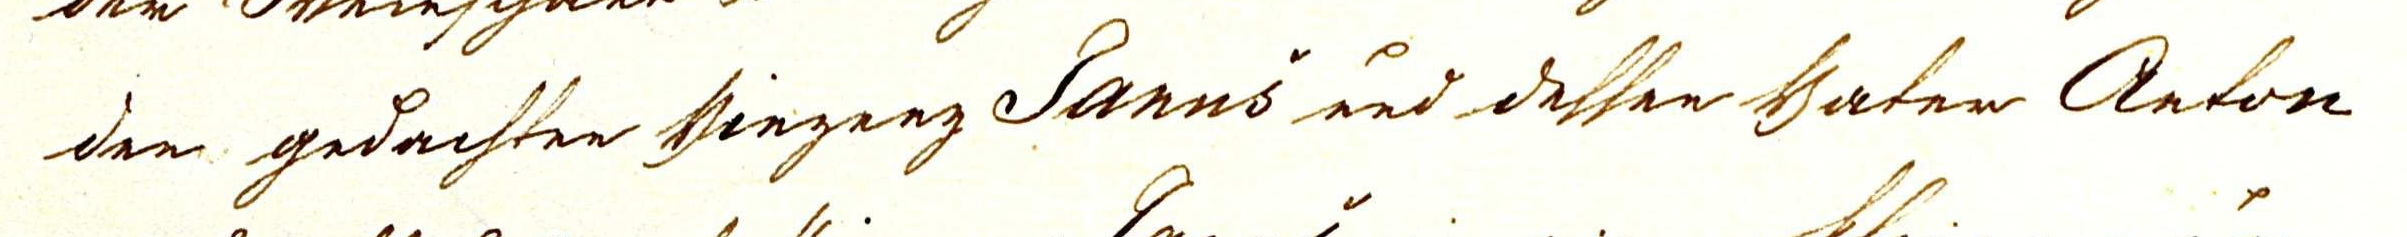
den gedachten Vinzenz Januš und dessen Vater Anton
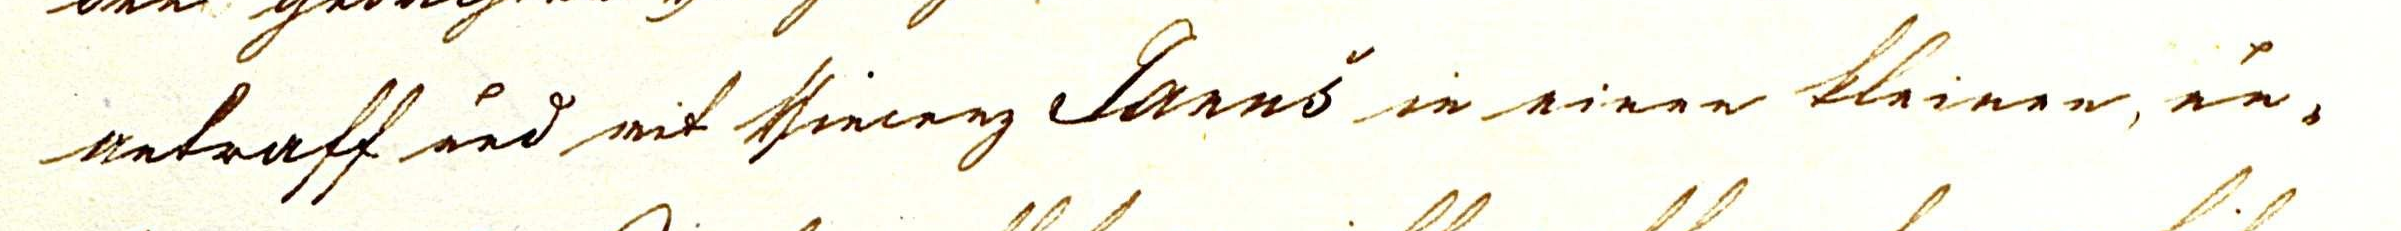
antraff und mit Vincenz Januš in einen kleinen, un¬
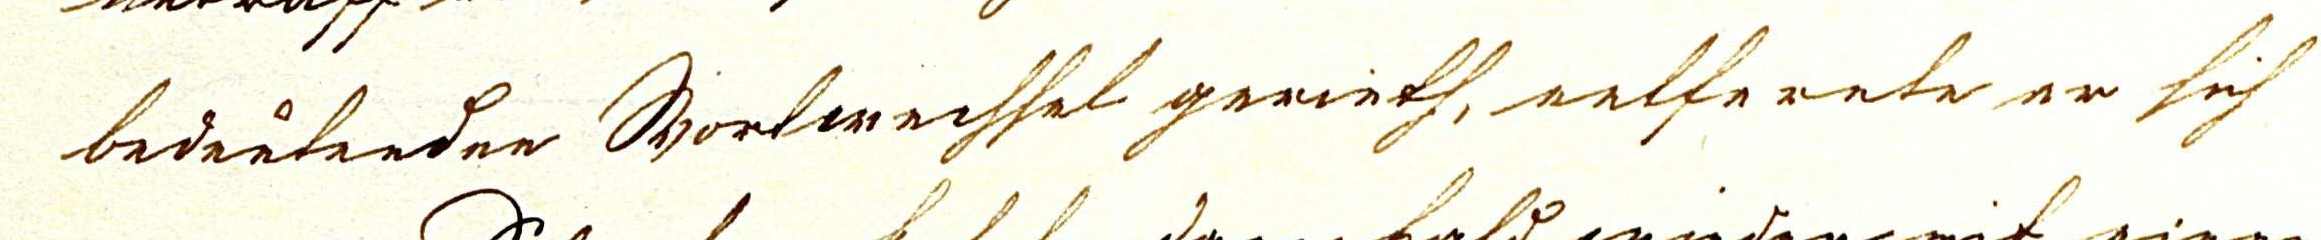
bedeutenden Wortwechselt gerieth, entfernte er sich
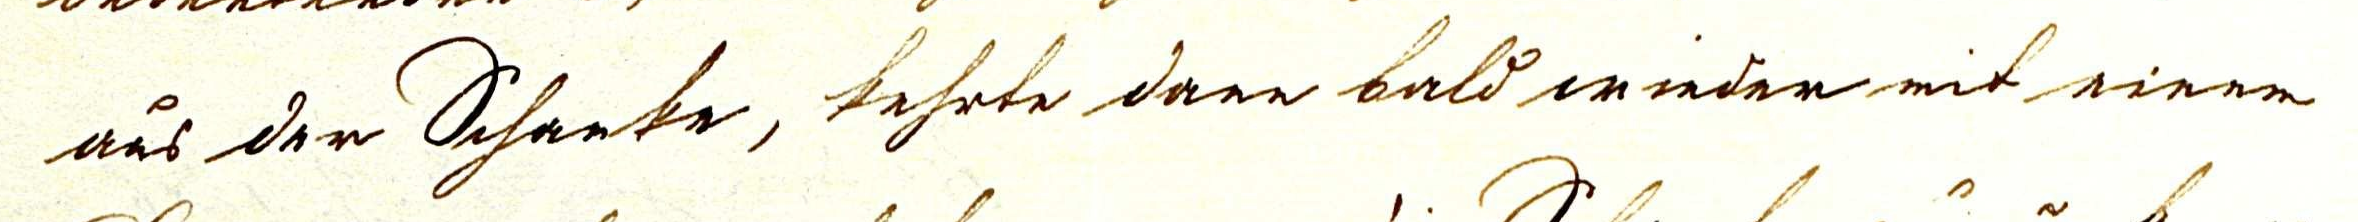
aus der Schanke, kehrte dann bald wieder mit einem
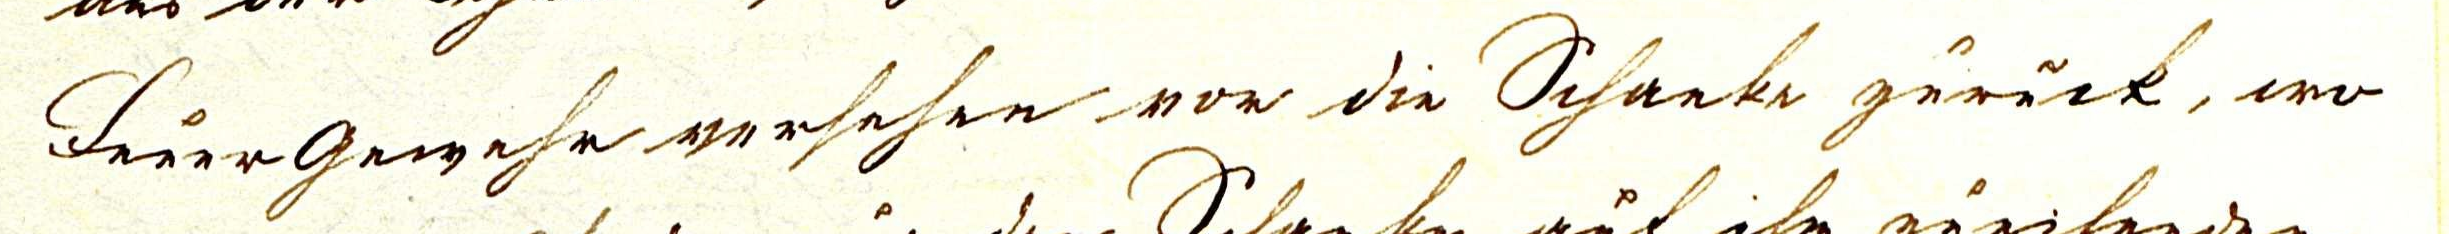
Feuer Gewehr versehen vor die Schanke zurück, wo
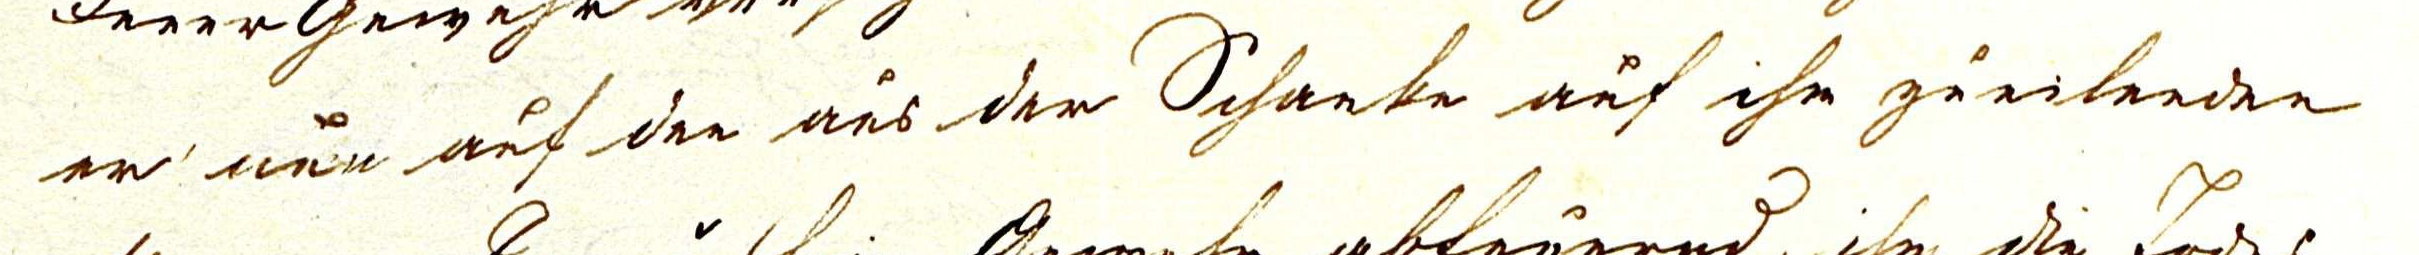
er nun auf den aus der Schanke auf ihm geeilenden
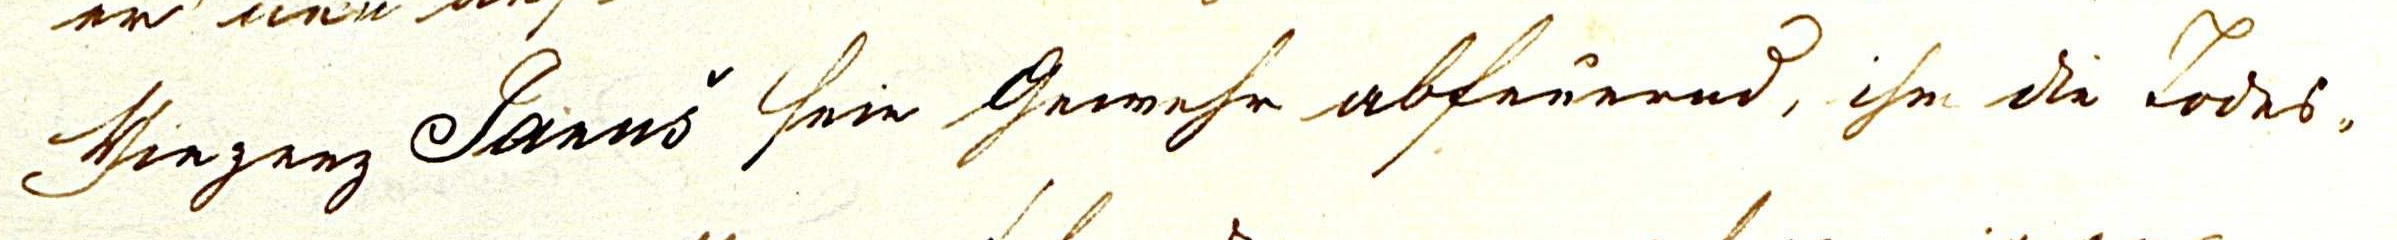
Vinzen Januš sein Gewehr abfeuernd, ihm die Todes¬
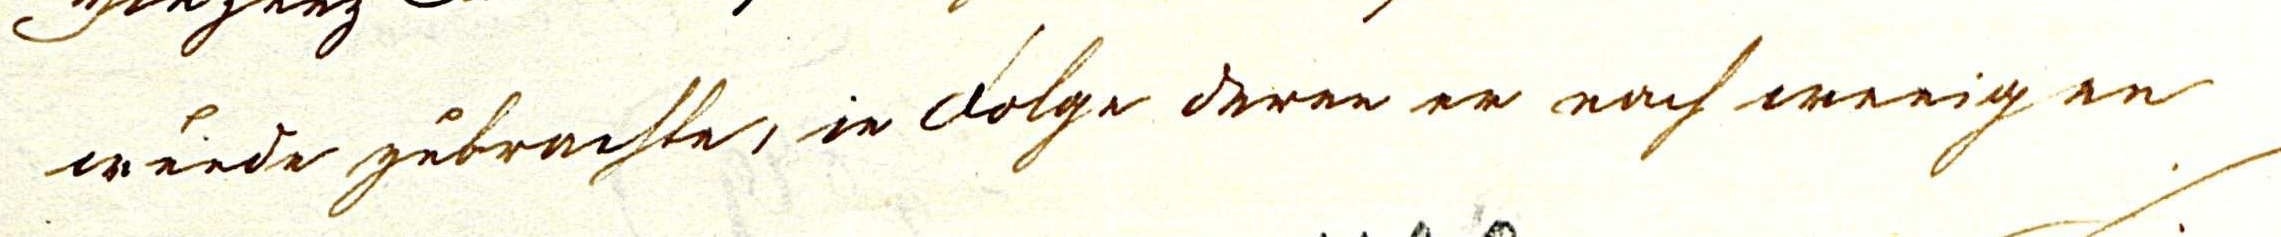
wunde gebrachte, in Folge deren er nach wenigen
